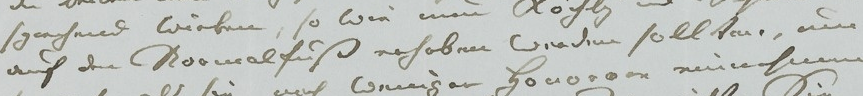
auf den Normalfuß erhoben werden sollten, um
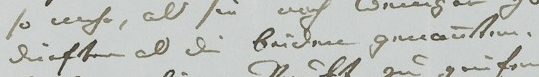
dürften als die beiden genannten.
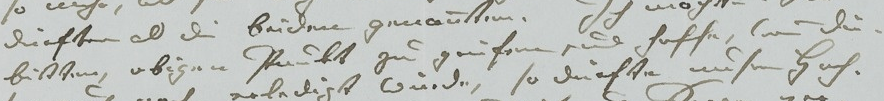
bitte, obigen Punkt zu prüfen, und hoffe, wenn die-
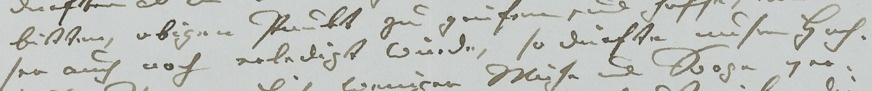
ser auch noch erledigt würde, so dürfte unsre Hoch-
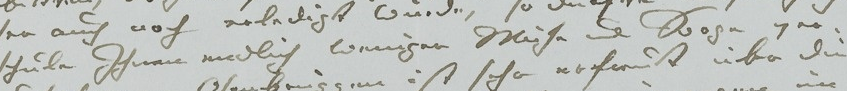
schule Ihnen endlich weniger Mühe und Sorgen ver-
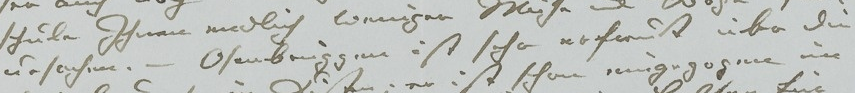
ursachen. – Osenbrüggen ist sehr erfreut über die
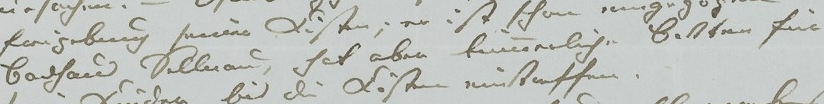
Badhaus Sellnau, hat aber kümmerliche Betten für
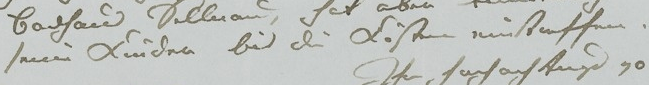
seine Kinder bis die Kisten eintreffen.
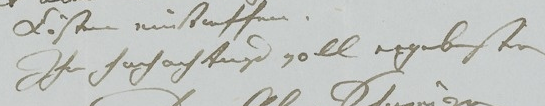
Ihr hochachtungsvoll ergebenster
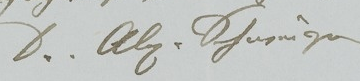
Dr. Alex. Schweizer
